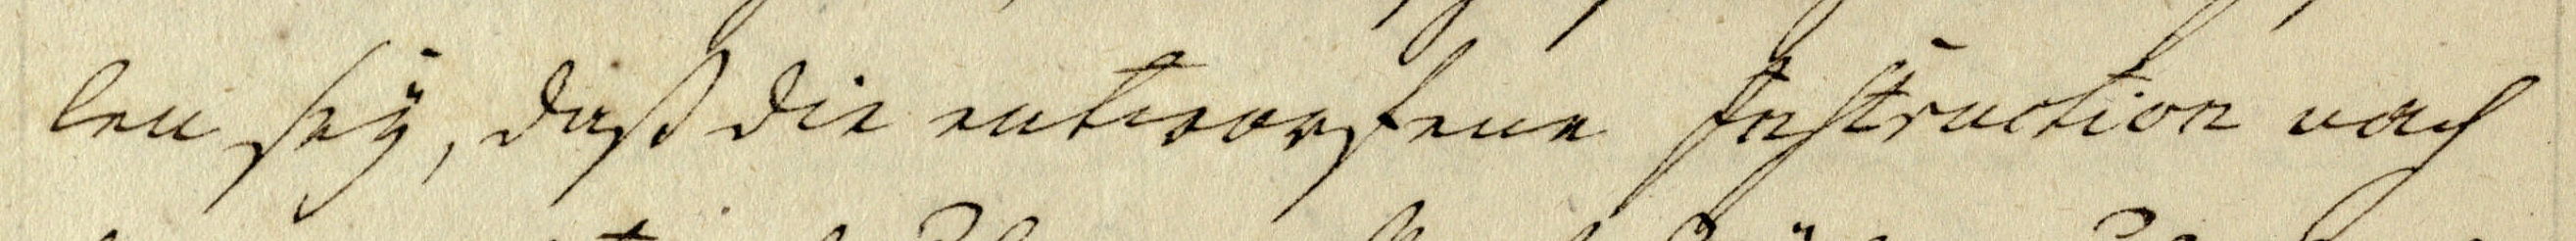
len seÿ, daß die entworfene Instruction nach
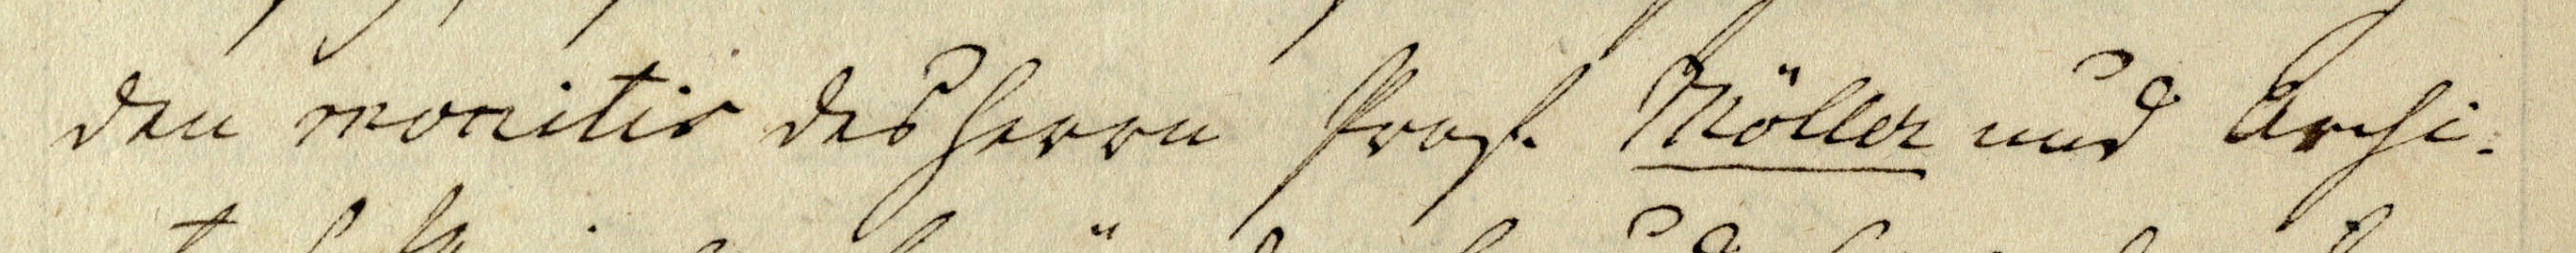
den monitis des Herrn Prof. Möller und Archi¬
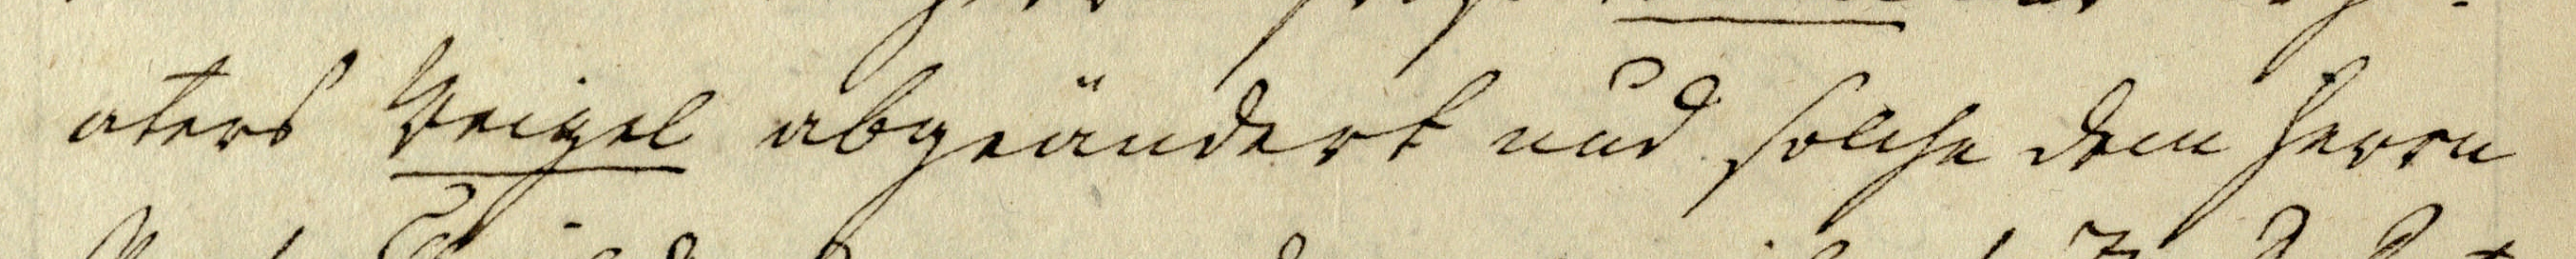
aters Weigel abgeändert und solche dem Herrn
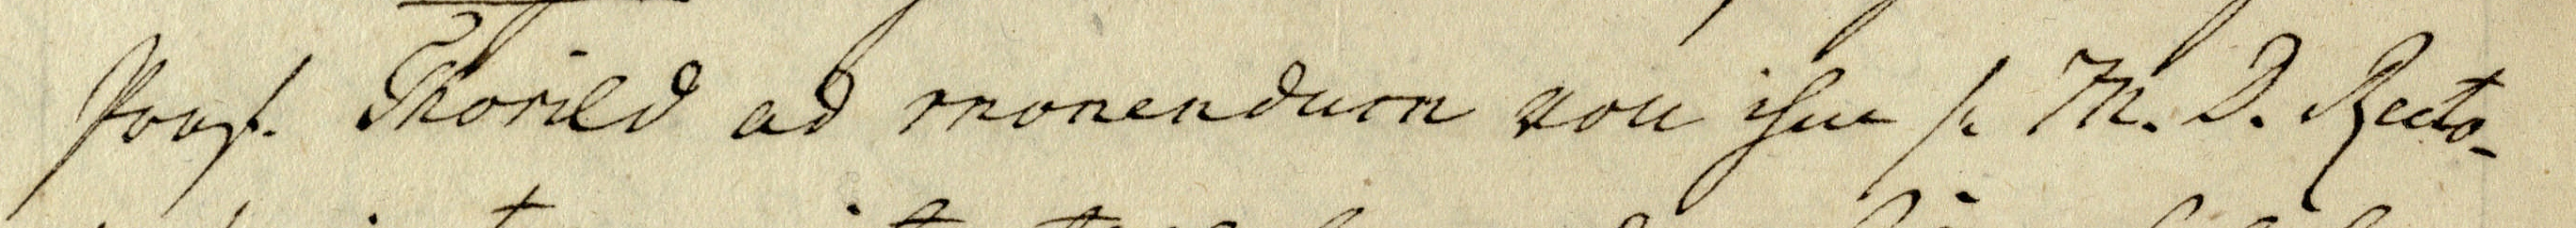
Prof. Thorild ad monendum von ihm /. M. D. Recto¬
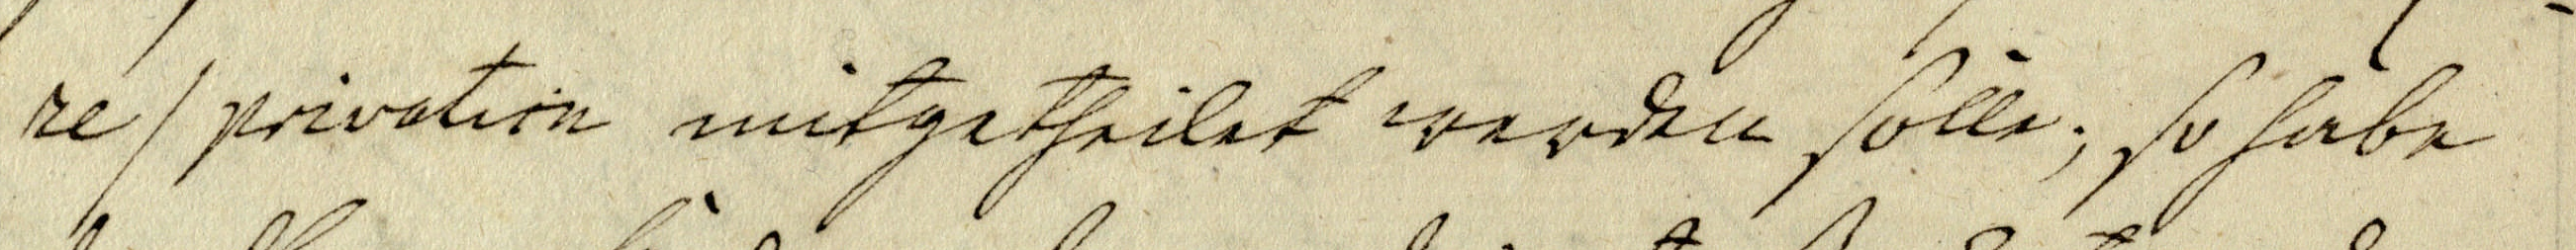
re / privatim mitgetheilet werden solle; so habe
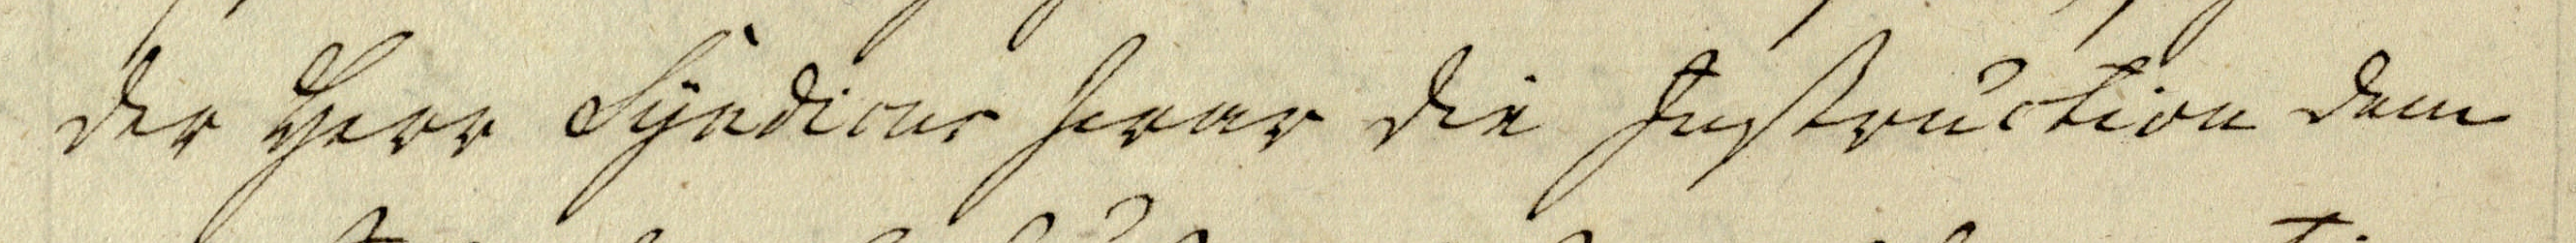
der Herr Sÿndicus zwar die Instruction dem
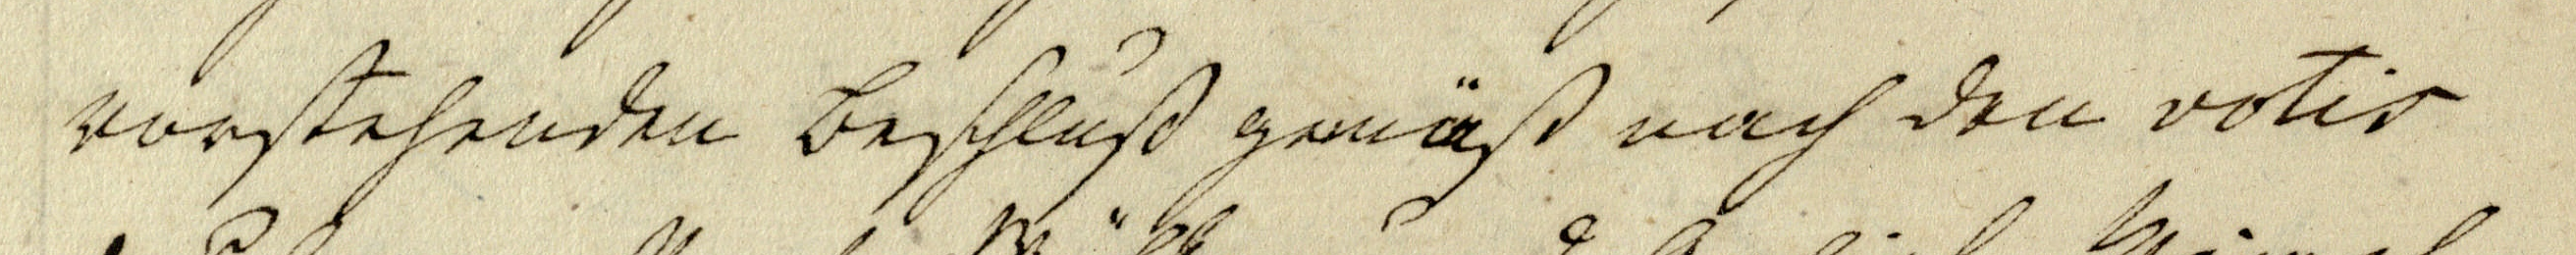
vorstehenden Beschluß gemäß nach den votis
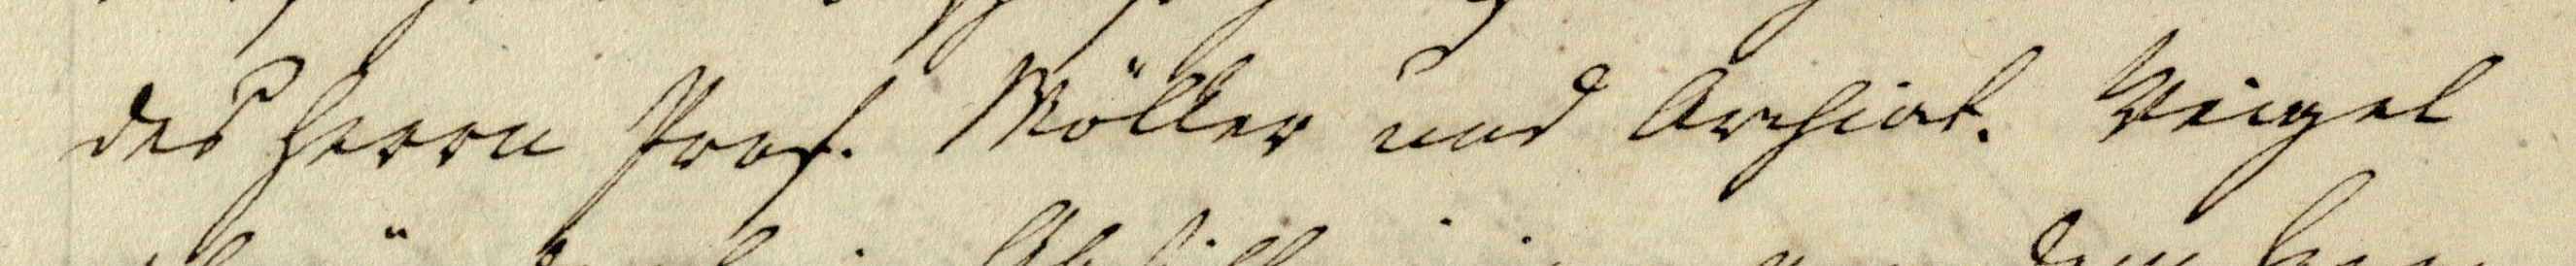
des Herrn Prof. Möller und Archiat. Weigel
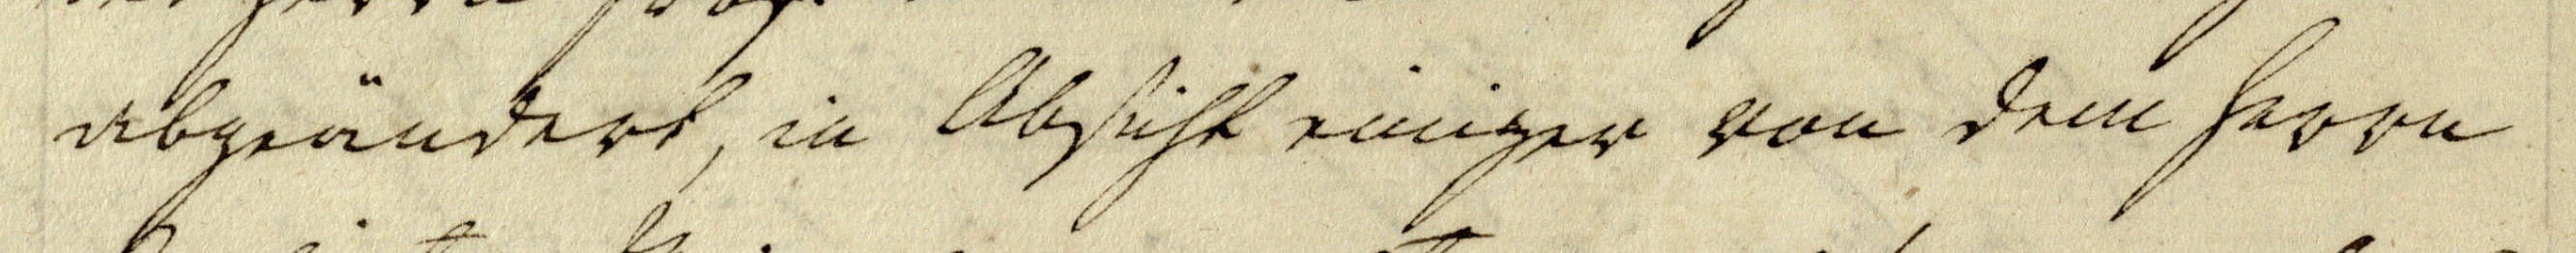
abgeändert, in Absicht einiger von dem Herrn
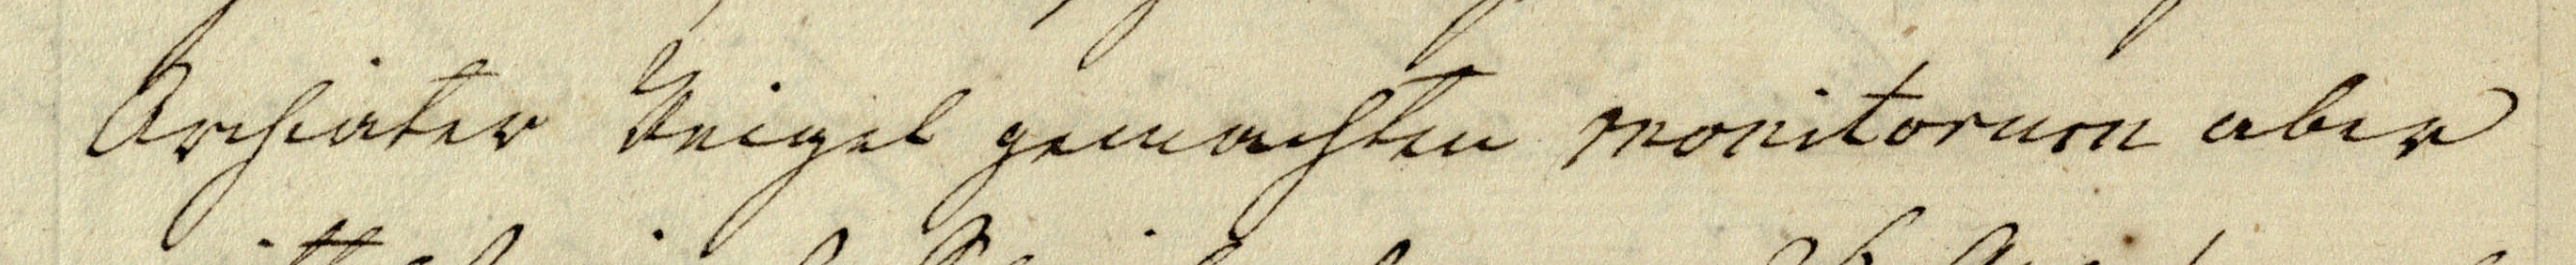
Archiater Weigel gemachten monitorum aber
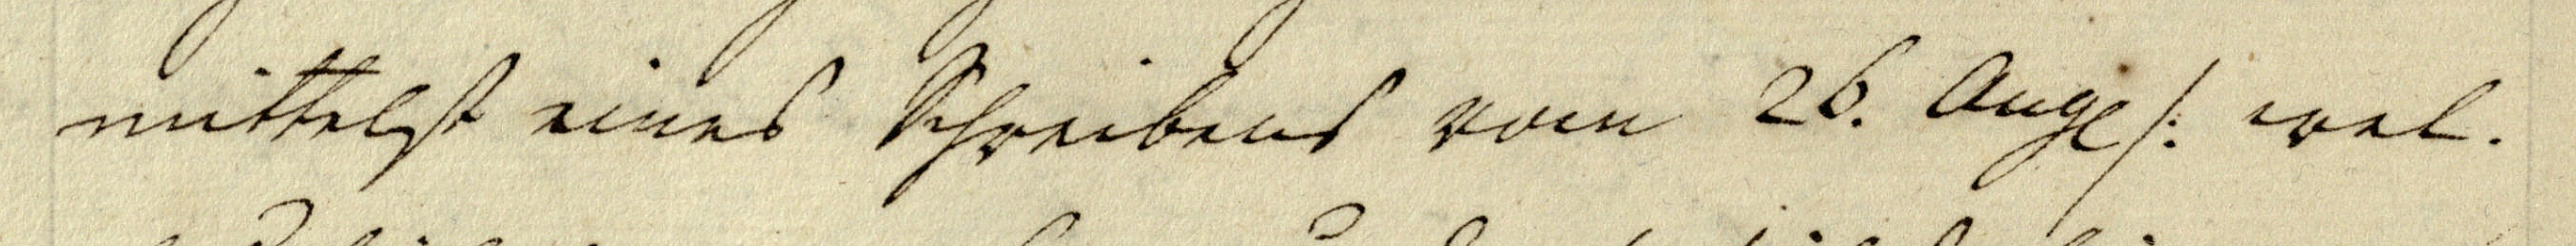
mittelst eines Schreibens vom 26. Aug. /: wel¬
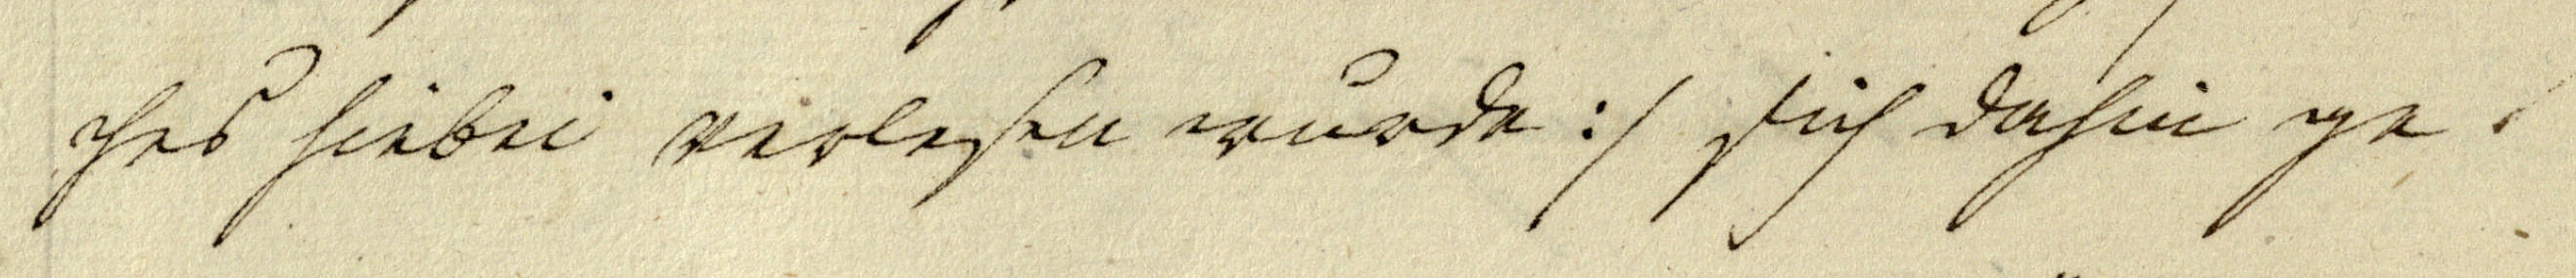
ches hiebei verlesen wurde :/ sich dahin ge¬
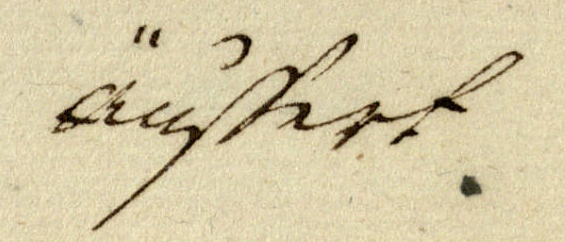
äussert
